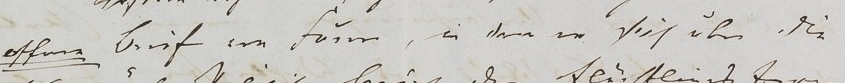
offnen Brief von Furrer, in dem er sich über die
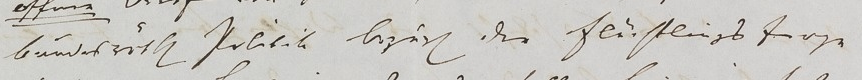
bundesräthl Politik bezügl der Flüchtlingsfrage
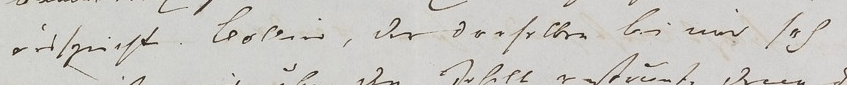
ausspricht. Bollier, der denselben bei mir sah
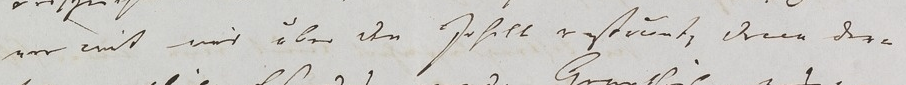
war mit mir über den Inhalt erstaunt, denn der-
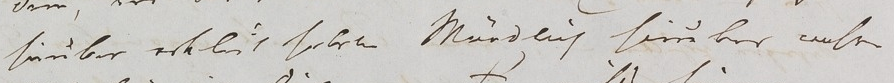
hierüber erklärt haben. Mündlich hierüber mehr.
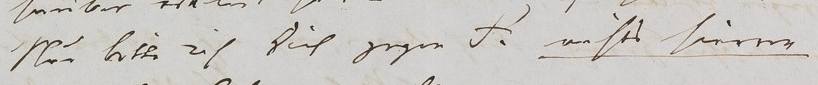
Nur bitte ich Dich gegen F.nichts hiervon
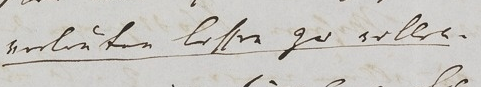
verlauten lassen zu wollen.
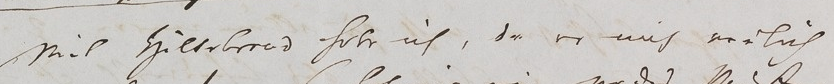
Mit Hiltebrand habe ich, da er mich neulich
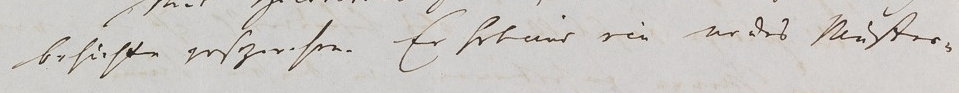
besuchte gesprochen. Er hat mir ein neues Müster-
